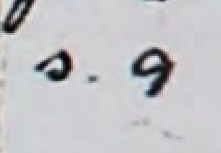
s. 9
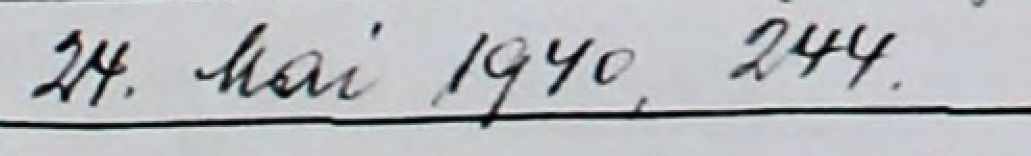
24. Mai 1940, 244.
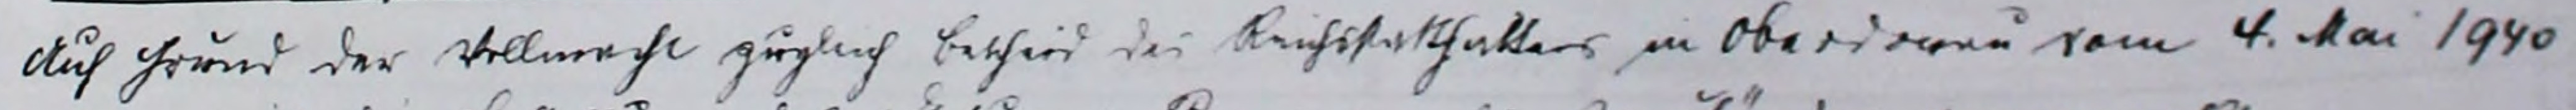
Auf Grund der Vollmacht Gupleich Bescheid der Reichsstatthaklers in Oberdonau vom 4. Mai 1940
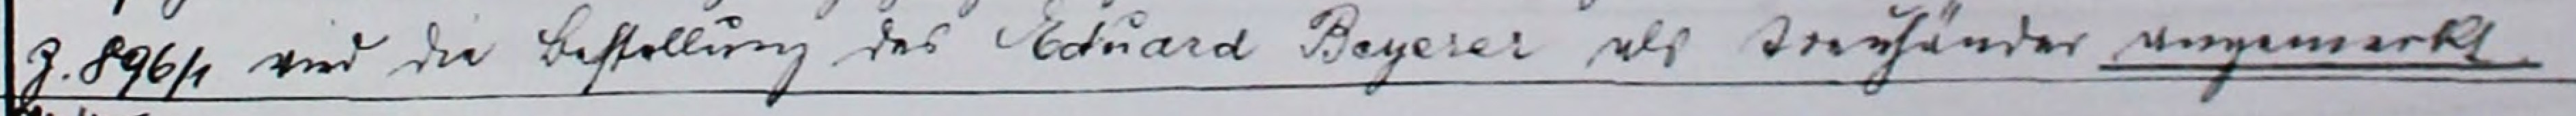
z. 896/1 wird die Bestellung des Eduard Beyerer als Treuhänder angemerkt.
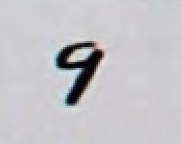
9
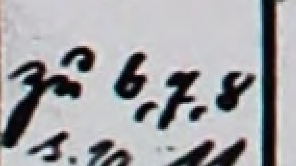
zu 6, 7, 8
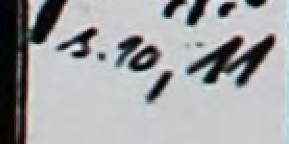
s. 10, 11
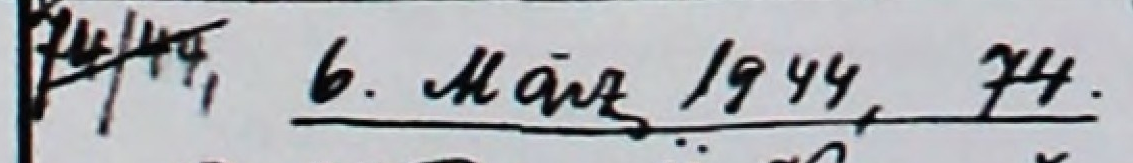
74/44, 6. März 1944, 74.
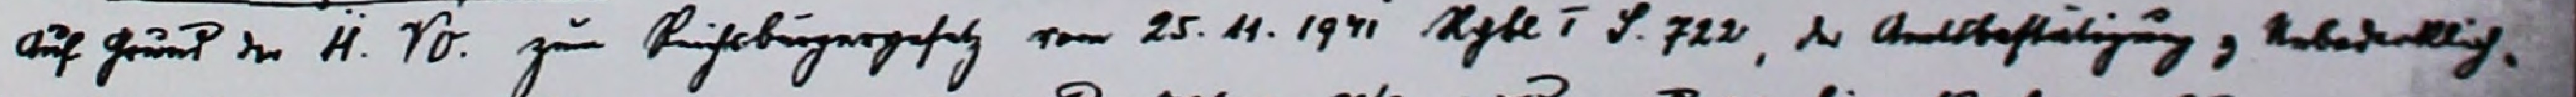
Auf Grund der 11. Vo. zum Reichsbürgergesetz vom 25.11.1971 Rgbl I S. 722, der Amtsbestätigung z Nebedenklich„
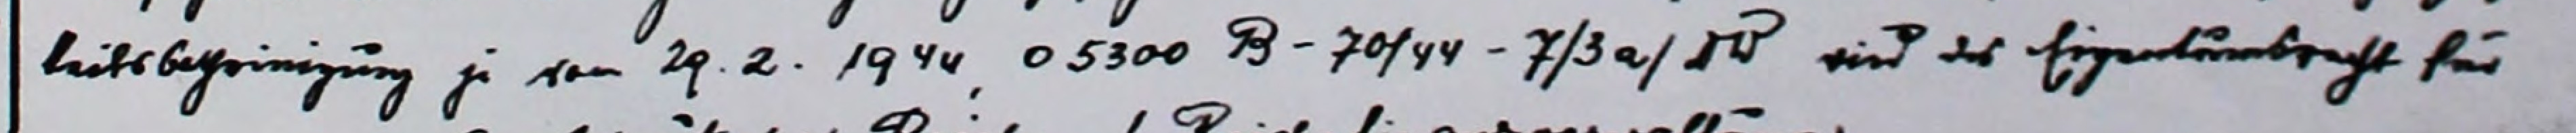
keitsbeschreinigung zu vom 29. 2. 1944 05300 B - 70/44 - 7/3a/Dr wird das Eigentumsrecht für
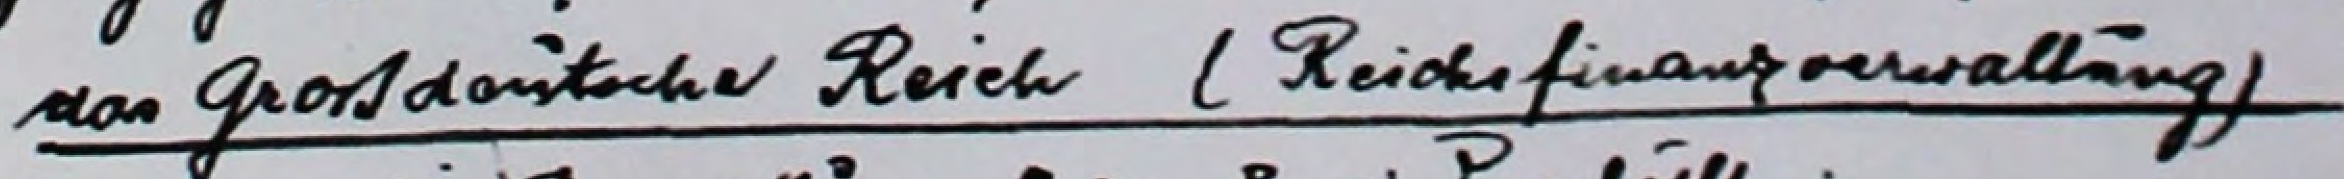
das Grostchauteche Reich (Reichsfinanzverwaltung)
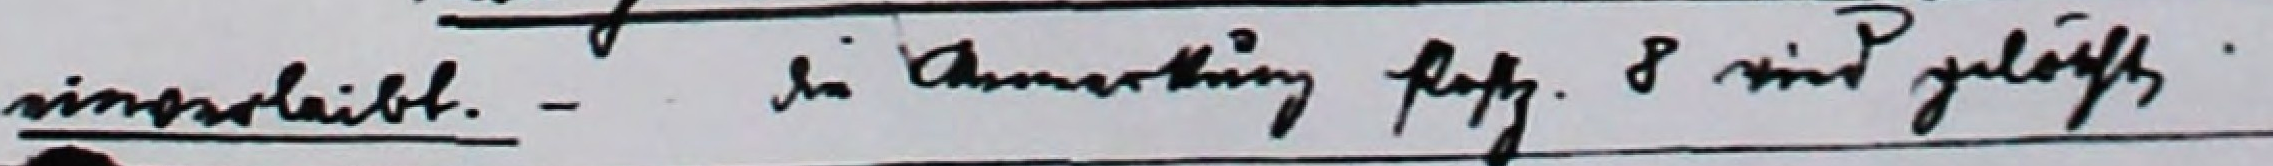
einverleibt. - die Anmerkung Postz. 8 wird gelöscht.
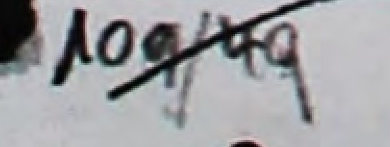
109/49
